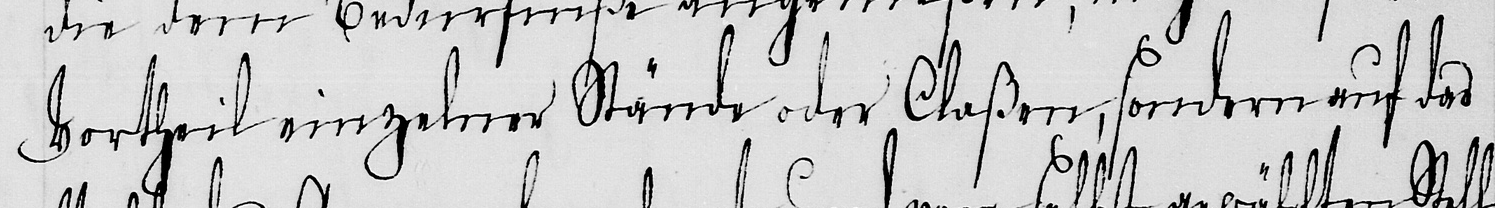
Vortheil einzelner Stände oder Claßen, sondern auf das
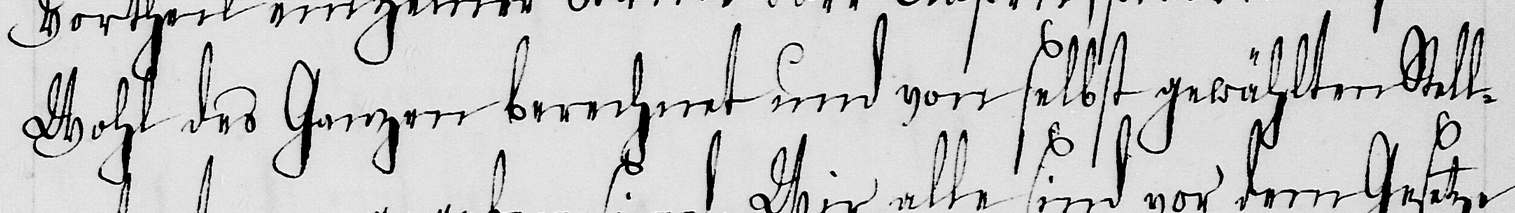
Wohl des Ganzen berechnet und von selbst gewählten Stel¬
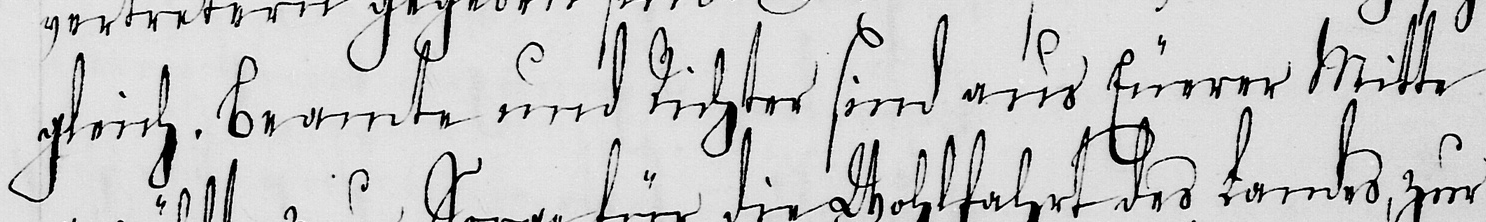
gleich. Beamte und Richter sind aus Euerer Mitte
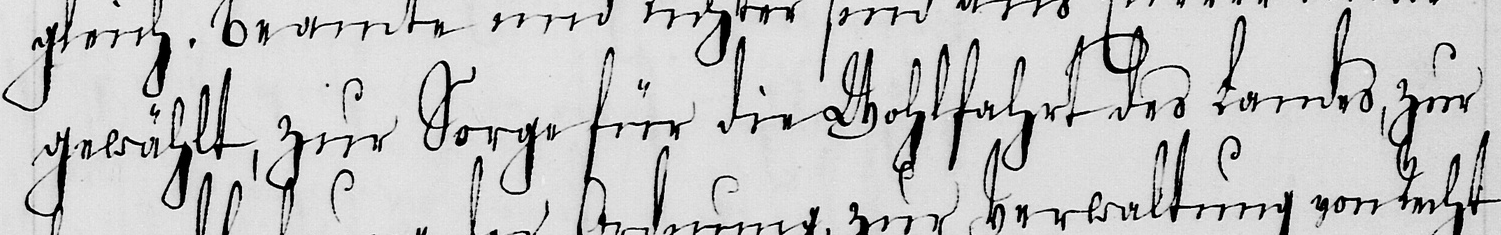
gewählt, zur Sorge für die Wohlfahrt des Landes, zur
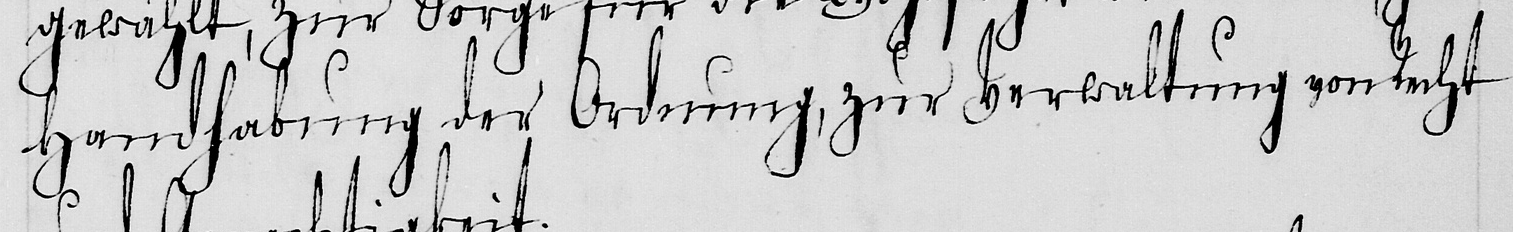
Handhabung der Ordnung, zur Verwaltung von Recht
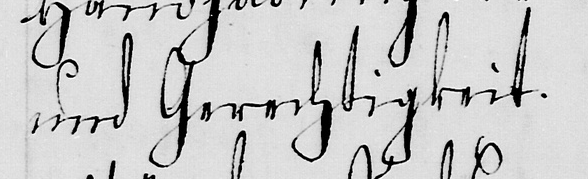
und Gerechtigkeit.
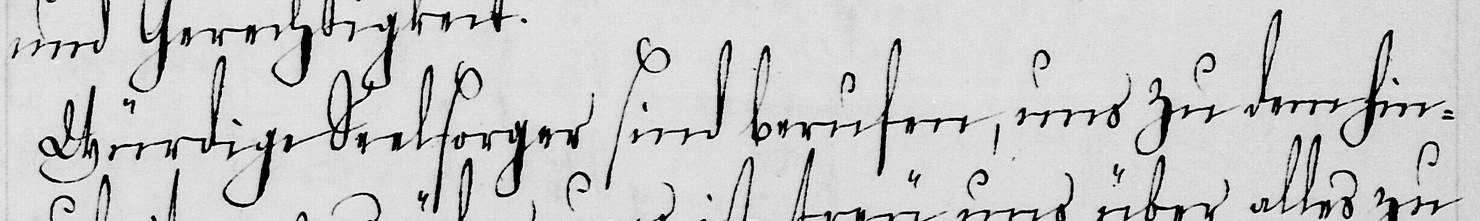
Würdige Seelsorger sind berufen, uns zu dem hin¬
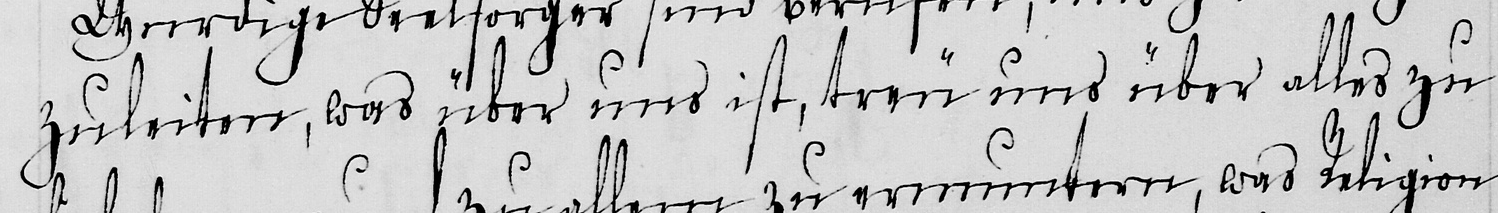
zuleiten, was über uns ist, treu uns über alles zu
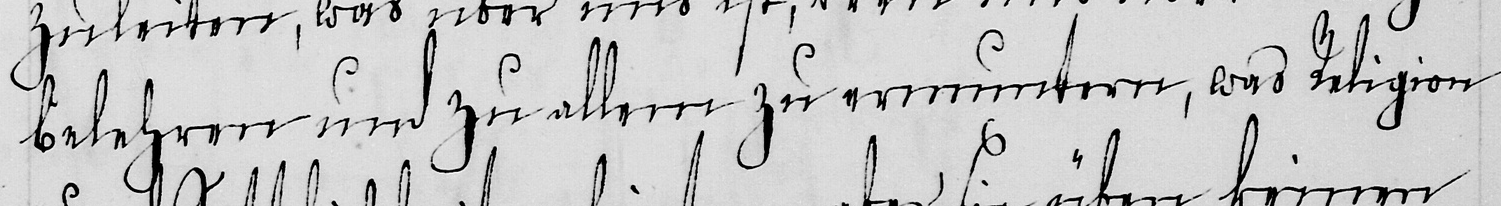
belehren und zu allem zu ermuntern, was Religion
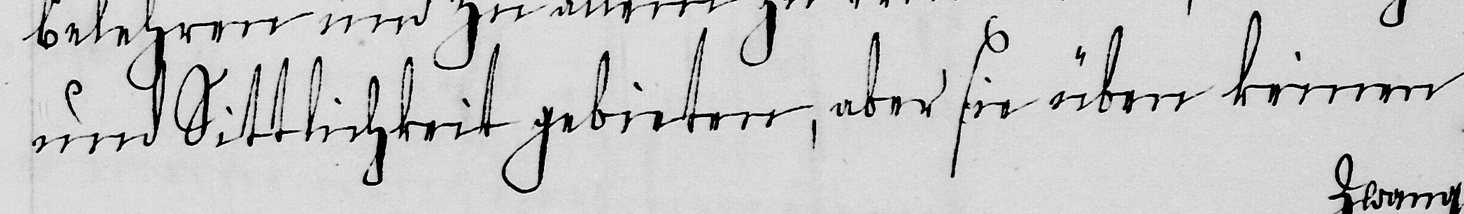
und Sittlichkeit gebieten, aber sie üben keinen
